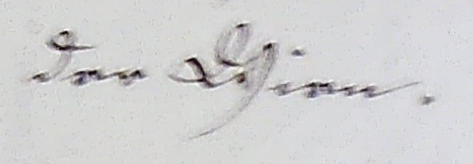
der Wien.
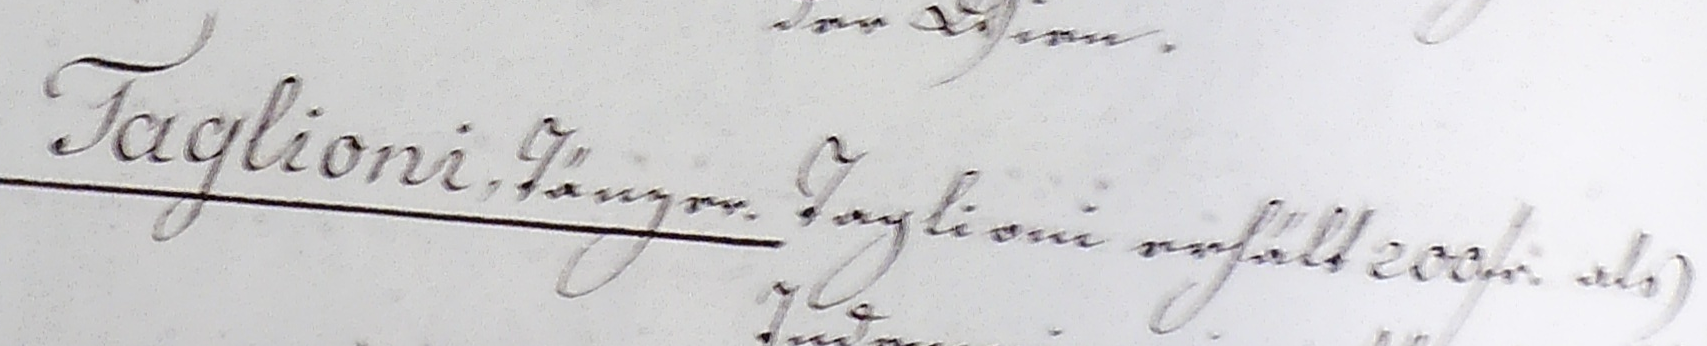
Taglioni, Tänzer. Taglioni erhält 200fr. als
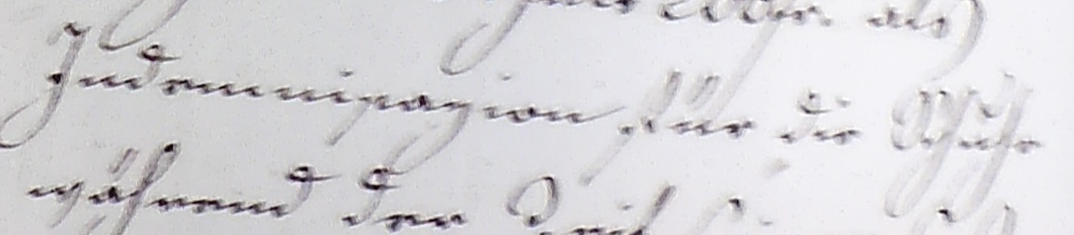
Indemnisazion für die Stücke
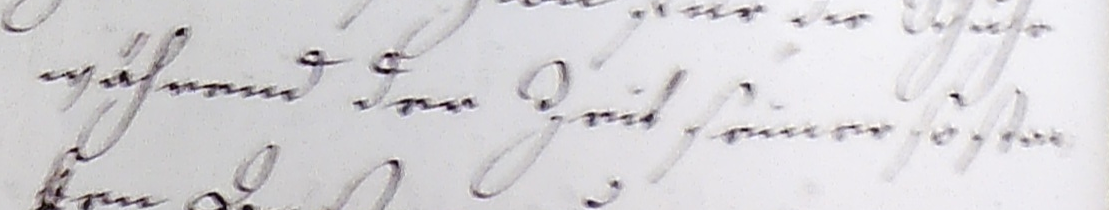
während der Zeit seiner so star¬
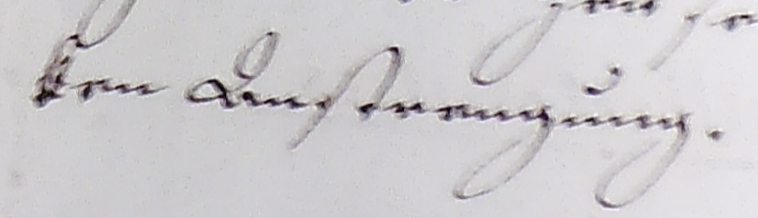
ken Anstrengung.
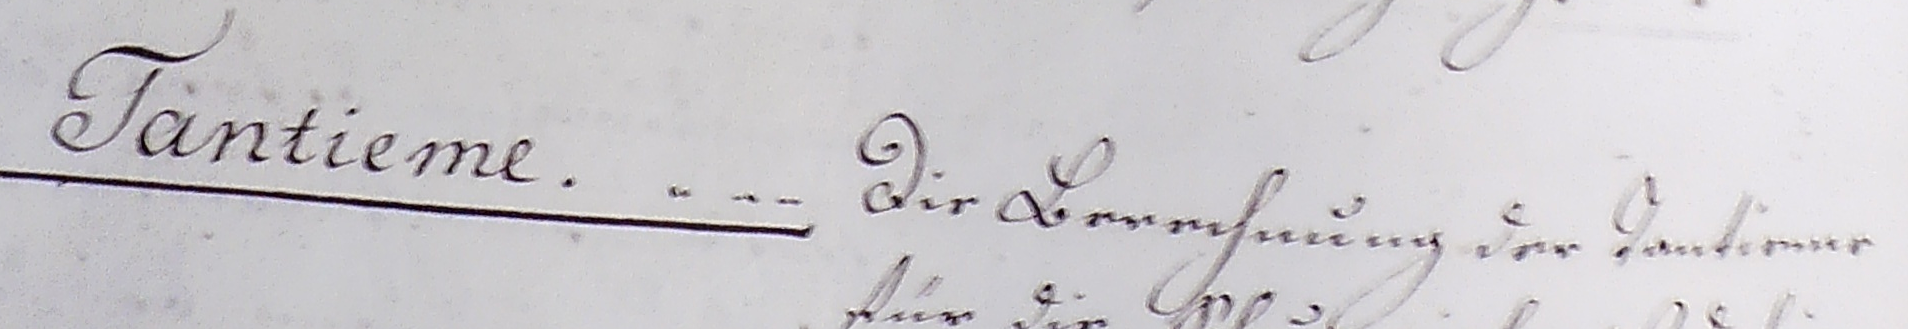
Tantieme. .. .. .. .. Die Berechnung der Tantieme
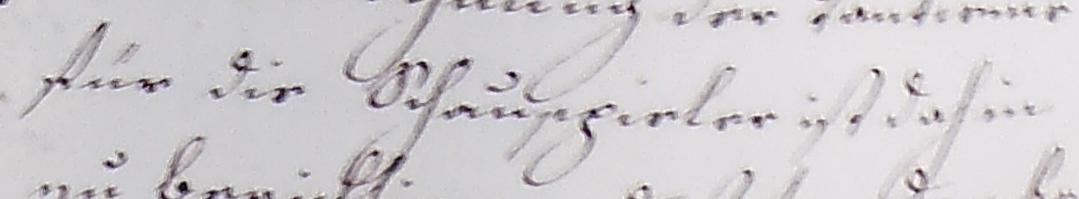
für die Schauspieler ist dafür
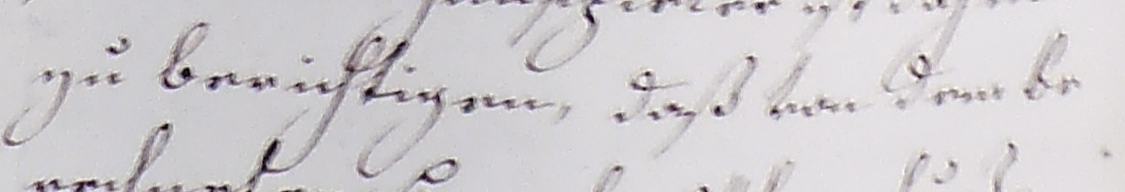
zu berichtigen, daß von dem be¬
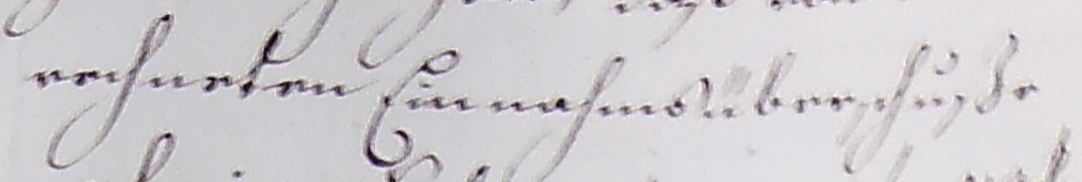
rechneten Einnahmsüberschuße
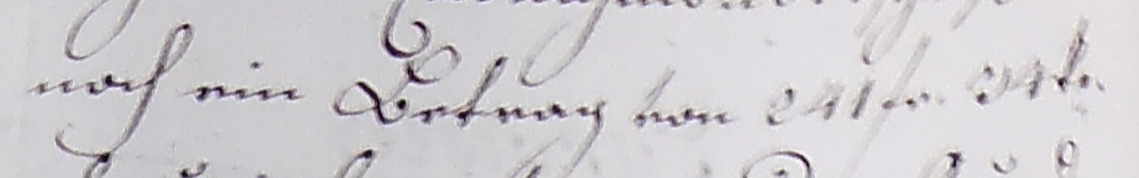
noch ein Betrag von 241fr. 34kr.
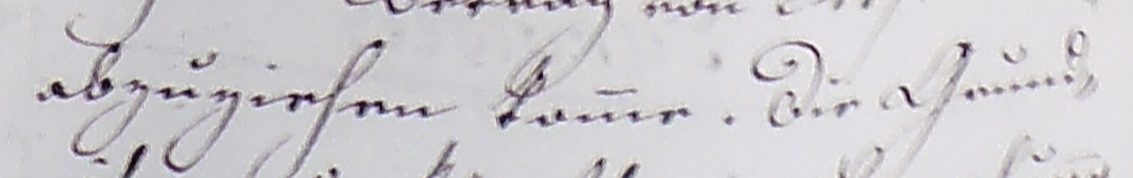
abzuziehen kom̅e. Die Grund¬
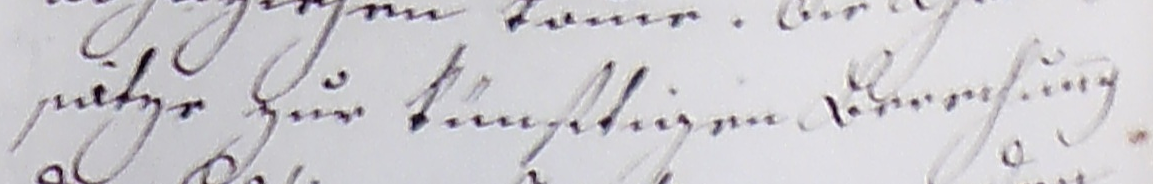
sätze zur künftigen Berechnung
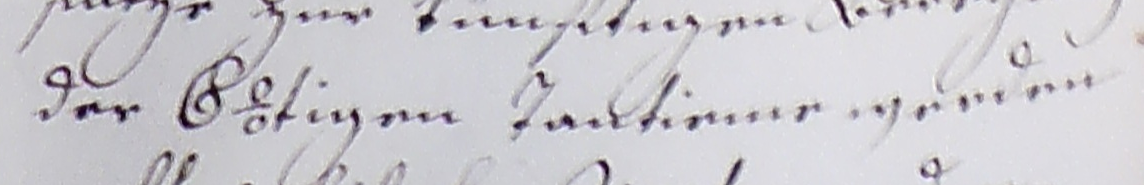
der 6%tigen Tantieme werden
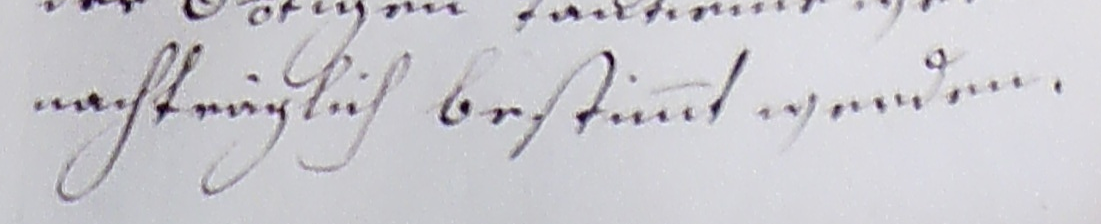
nachträglich bestim̅t werden.
